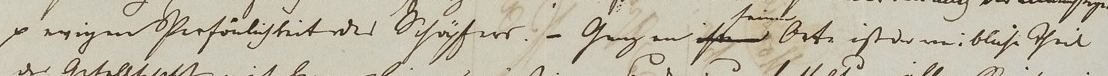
& ewigen Persönlichkeit des Schöpfers. – Ganz an ihremseinem Orte ist der weibliche Theil
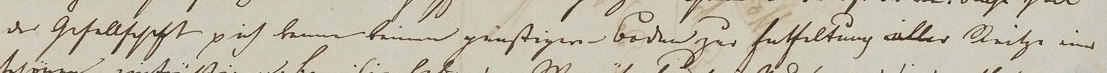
der Gesellschaft & ich kenne keinen günstigern Boden zur Entfaltung aller Reitze eines
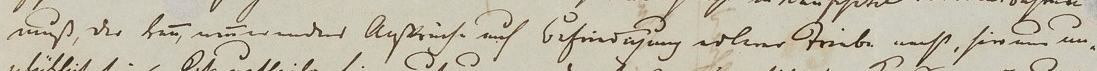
muß, der kann, wenn er anders Ansprüche auf Befriedigung edlerer Triebe macht, hier nur un-
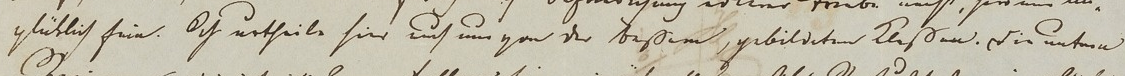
glüklich sein. Ich urtheile hier auch nur von den bessern, gebildeten Klassen. Die untern
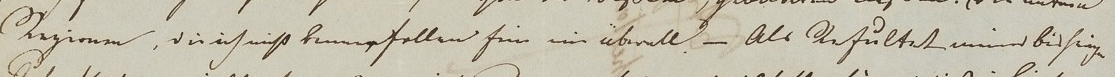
Regionen, die ich nicht kenne, sollen sein wie überall. – Als Resultat meines bisherigen
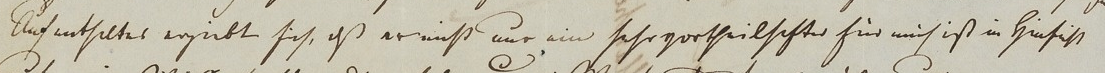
Aufenthaltes ergiebt sich, dß er nicht nur ein sehr vortheilhafter für mich ist in Hinsicht
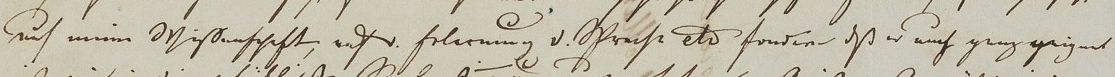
auf meine Wissenschaft, auf d. Erlernung d. Sprache etc. sondern dß er auch ganz geeignet
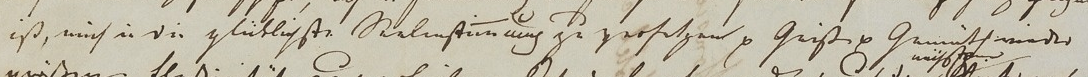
ist, mich in die glüklichste Seelenstimmung zu versetzen & Geist & Gemüth wieder
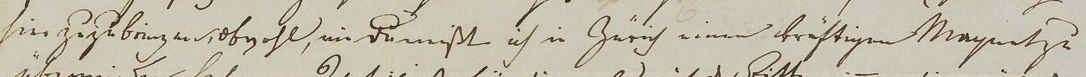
hier zuzubringen, obwohl, wie du weißt ich in Zürich einen kräftigen Magnet zu
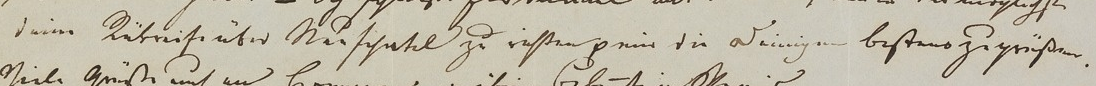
deine Rükreise über Neuschatel zu richten & mir die Deinigen bestens zu grüßen.
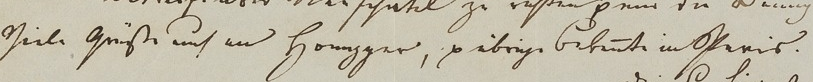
Viele Grüße auch an Honegger, & übrige Bekannte in Paris.
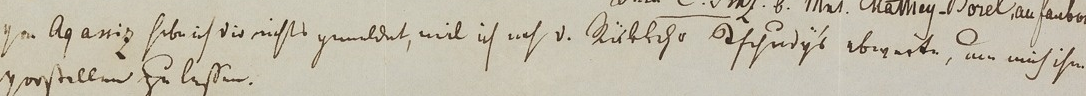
Von Agassiz habe ich dir nichts gemeldet, weil ich noch d. Rückkehr Tschudy's abwarte, um mich ihm
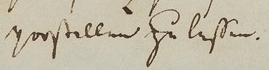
vorstellen zu lassen.
